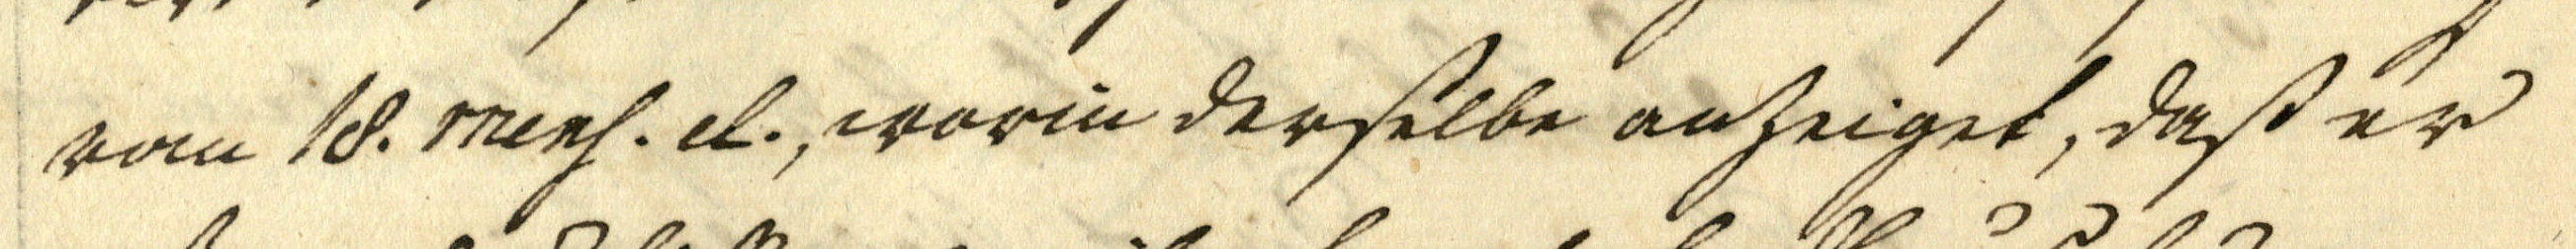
vom 18. mens. et. worin derselbe anzeiget, daß er
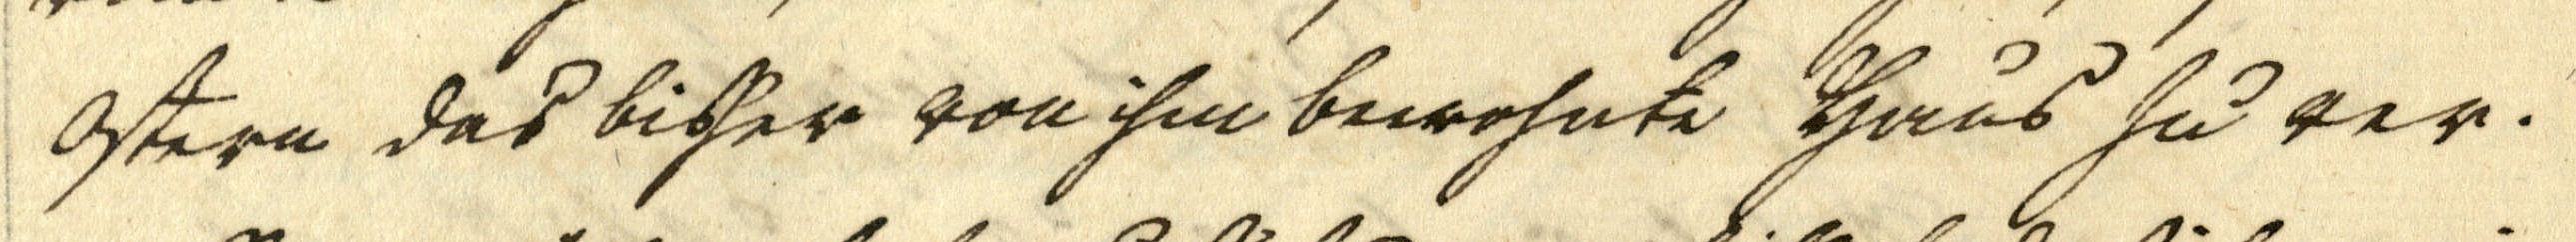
Ostern das bisher von ihm bewohnte Haus zu ver¬
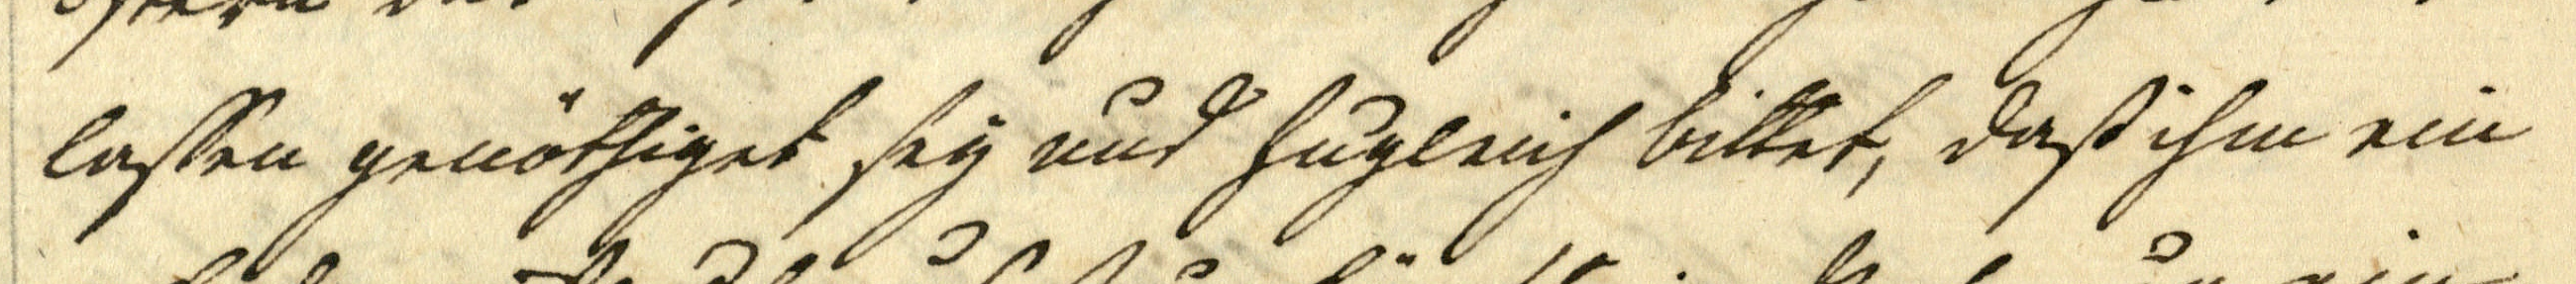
lassen genöthiget seÿ und zugleich bittet, daß ihm ein
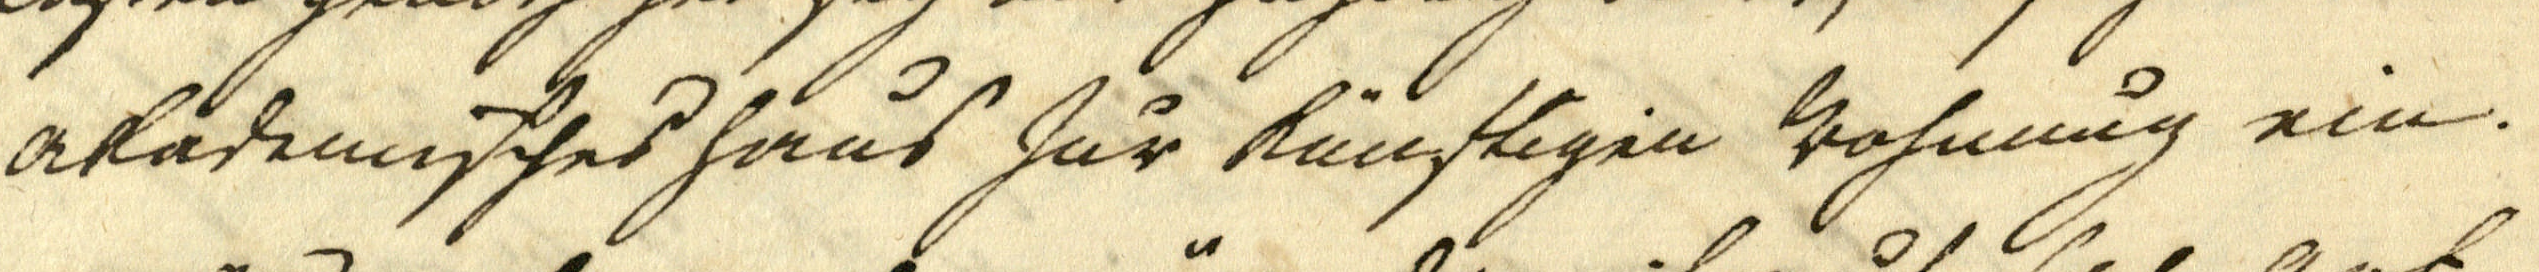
akademnisches Haus zur künftigen Wohnung ein¬
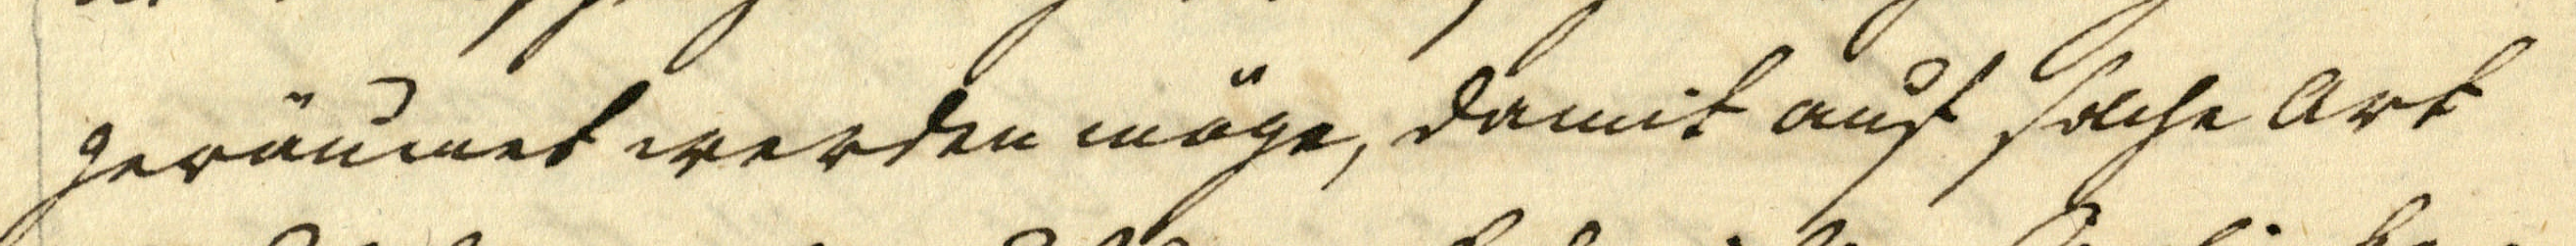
geräumet werden möge, damit auf solche Art
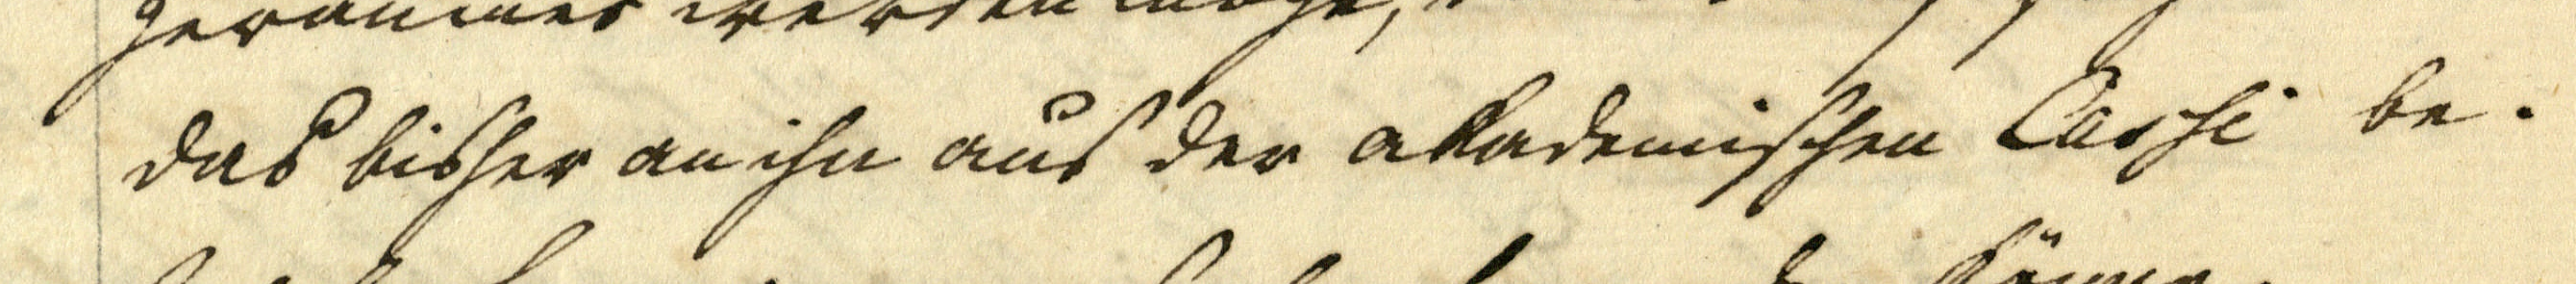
das bisher an ihn aus der akademischen Casse be¬
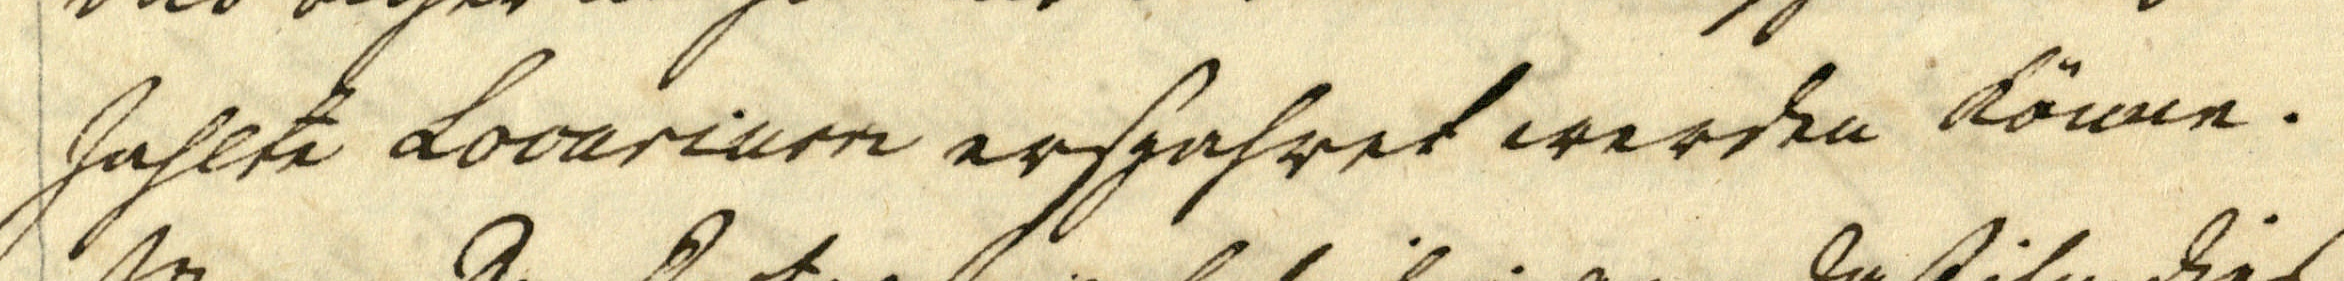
zahlte Locarium erspahret werden könne.
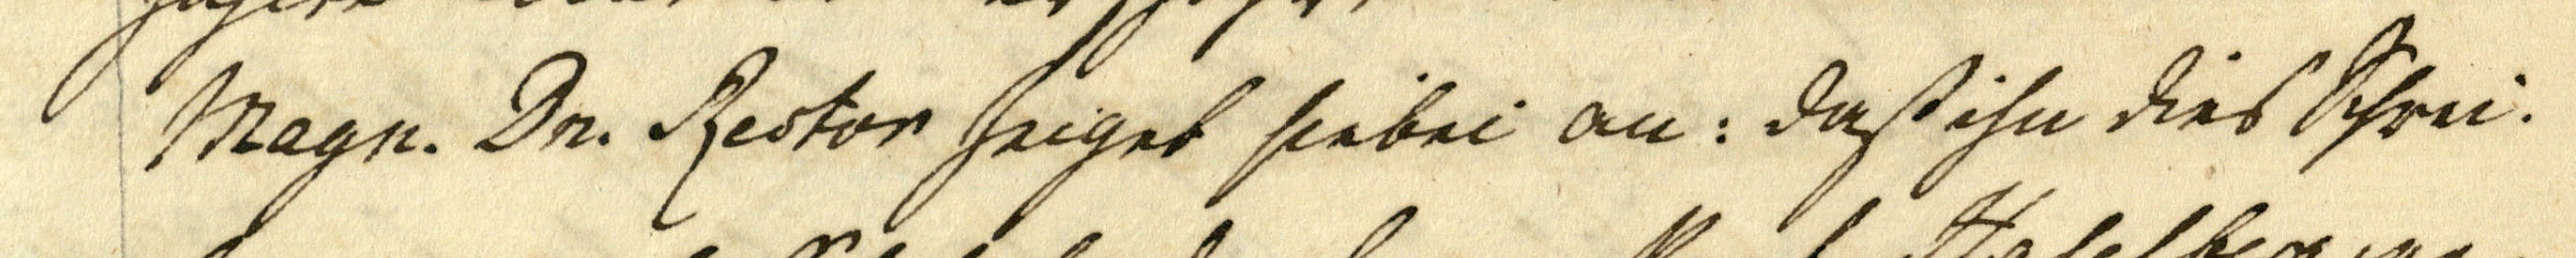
Magn. Dn. Rector zeiget hiebei an: daß ihn dies Schrei¬
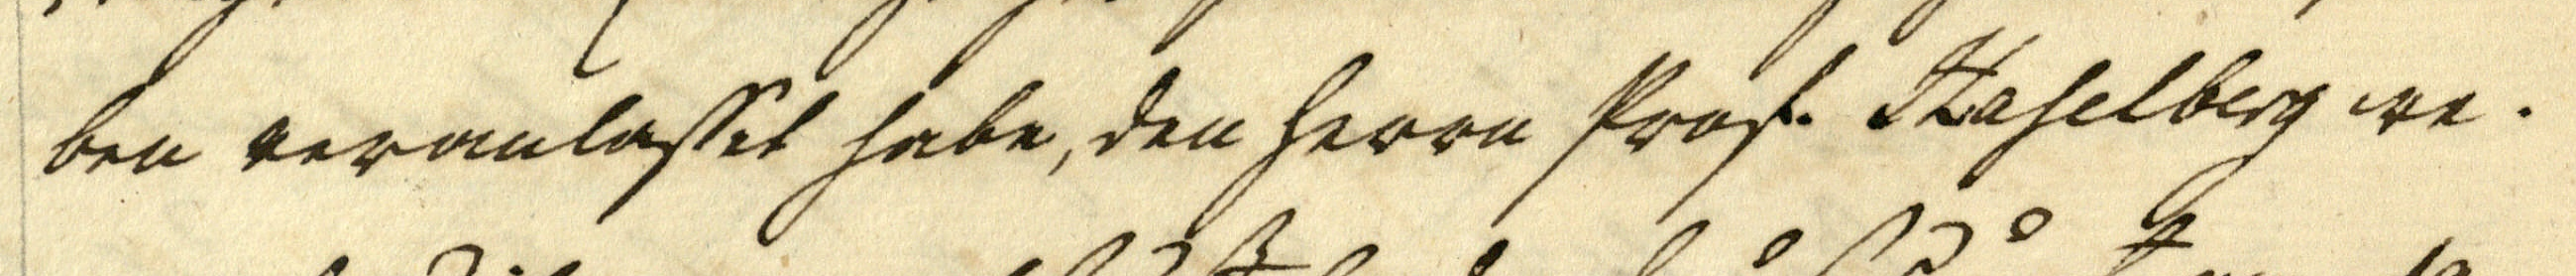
ben veranlasset habe, den Herrn Prof. Haselberg we¬
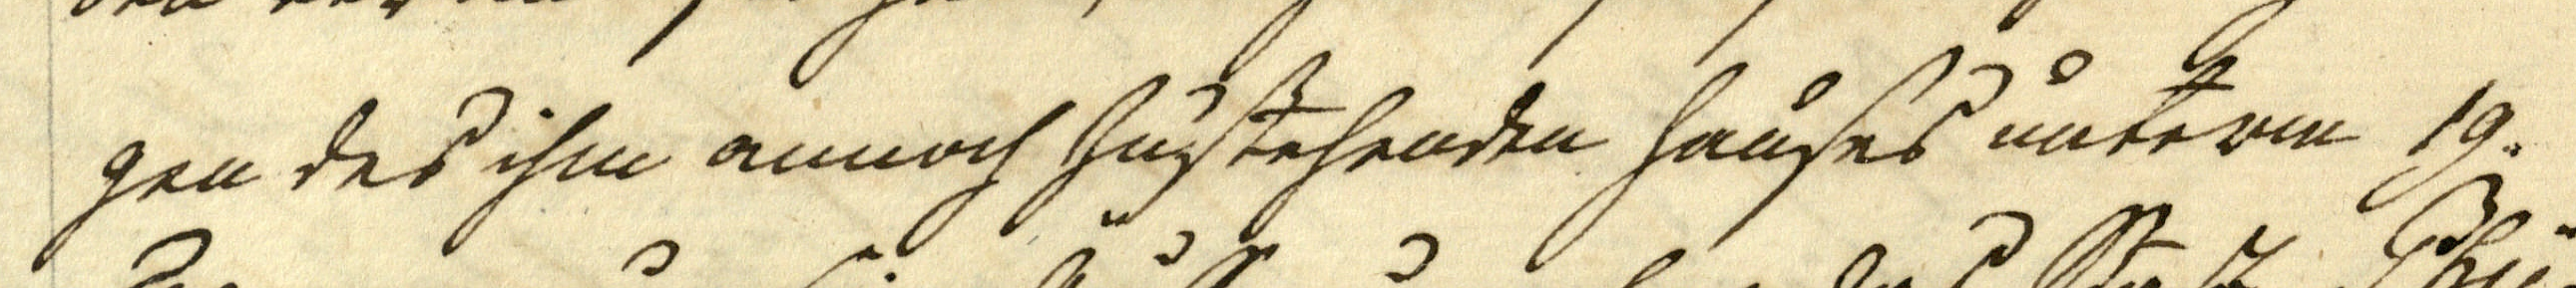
gen des ihm annoch zustehenden Hauses unterm 19.
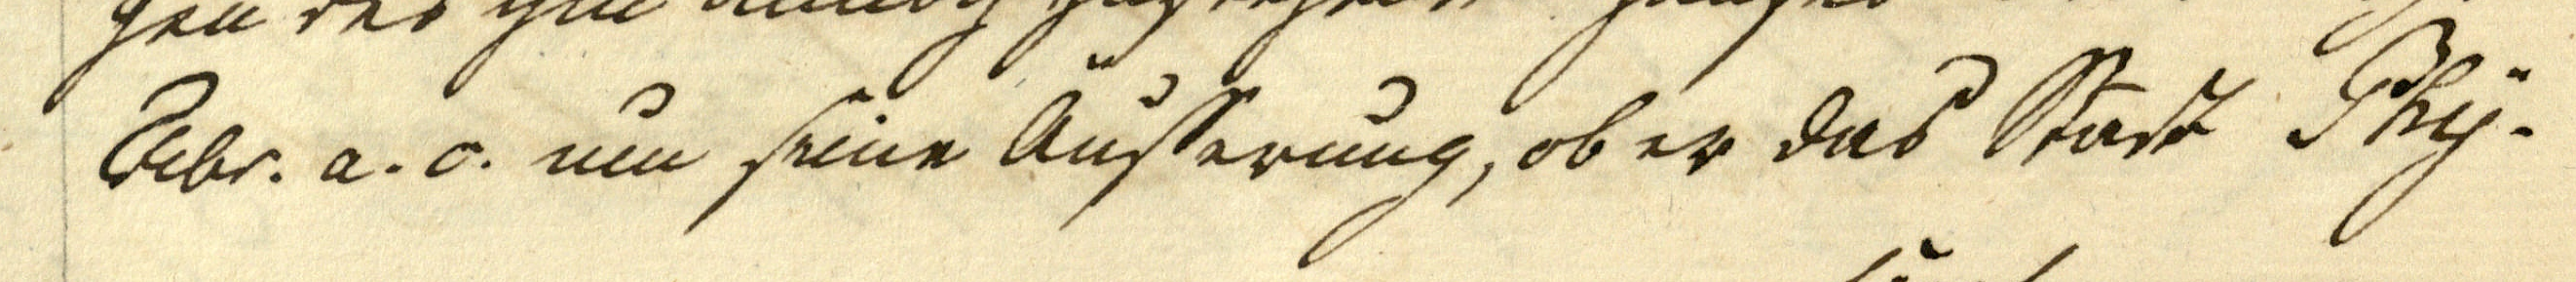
Febr. a. c. um seine Äusserung, ob er das Stadt Phÿ¬
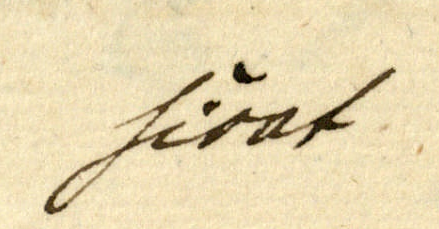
sicat
